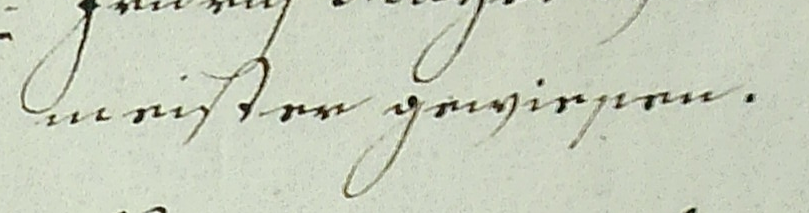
meister gewiesen.
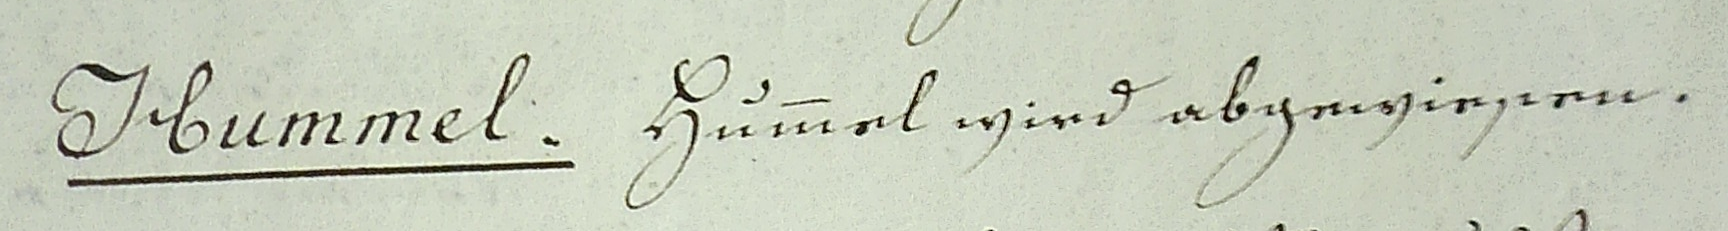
Hummel. Hum̅el wird abgewiesen.
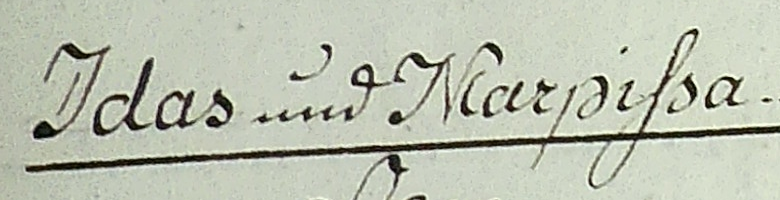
Idas und Marpissa ...
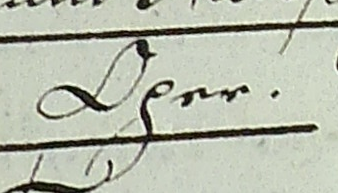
Oper.
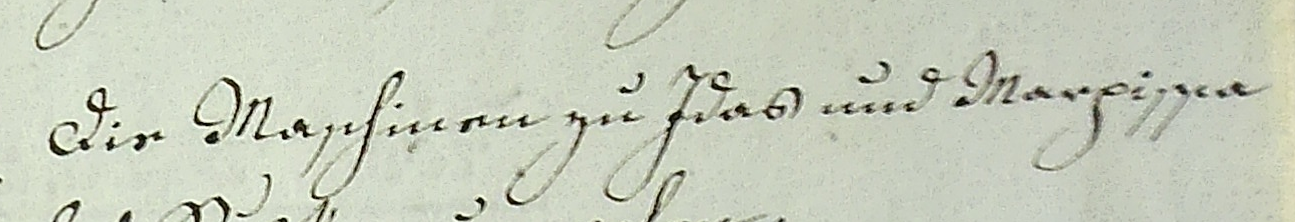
Die Maschinen zu Idas und Marpissa
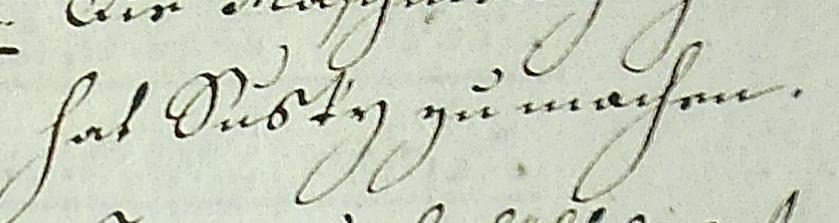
hat Susky zu machen.
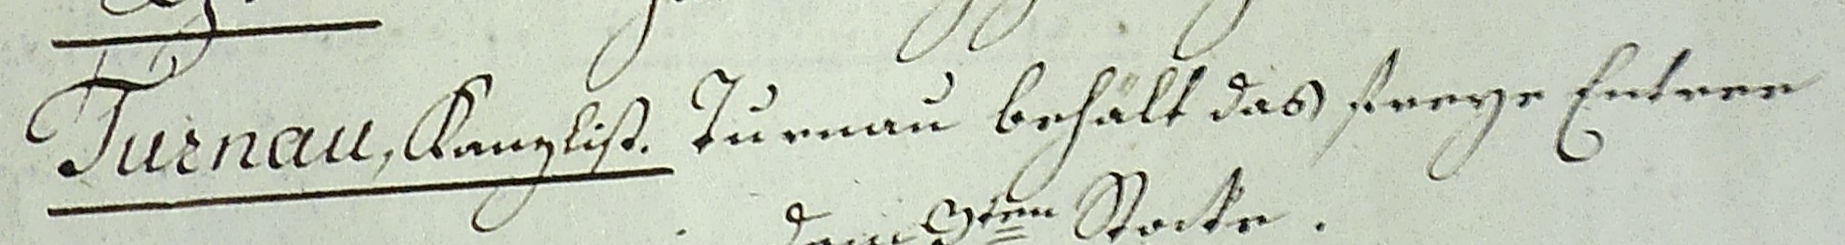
Turnau, Kanzlist. Turnau behält das freye Entree
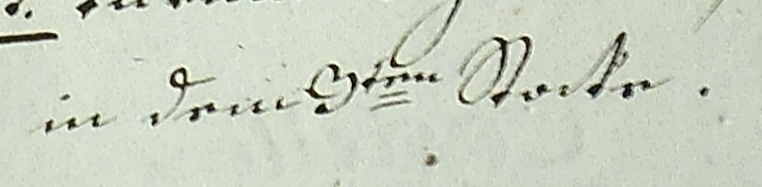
in den 3te͇n Stocke.
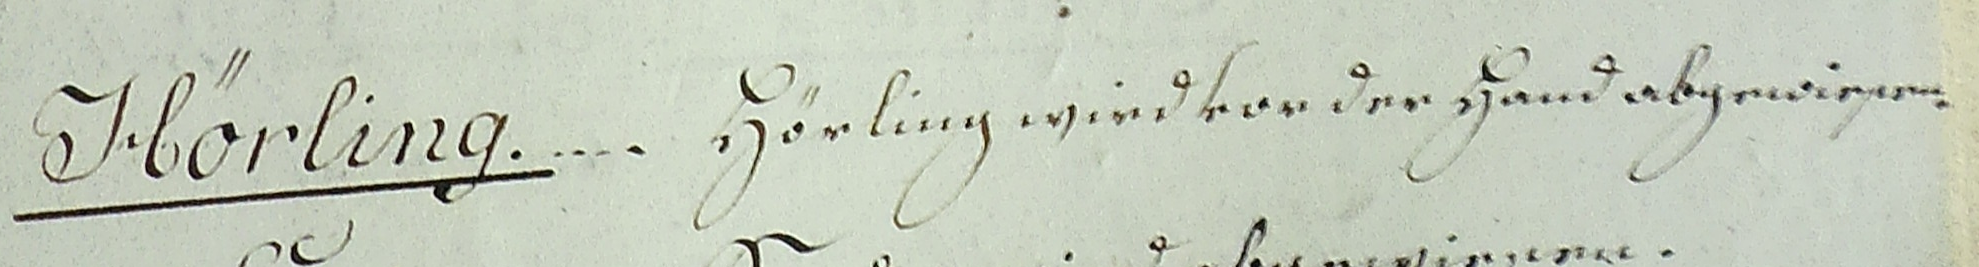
Hörling. .... Hörling wird vor der Hand abgewiesen.
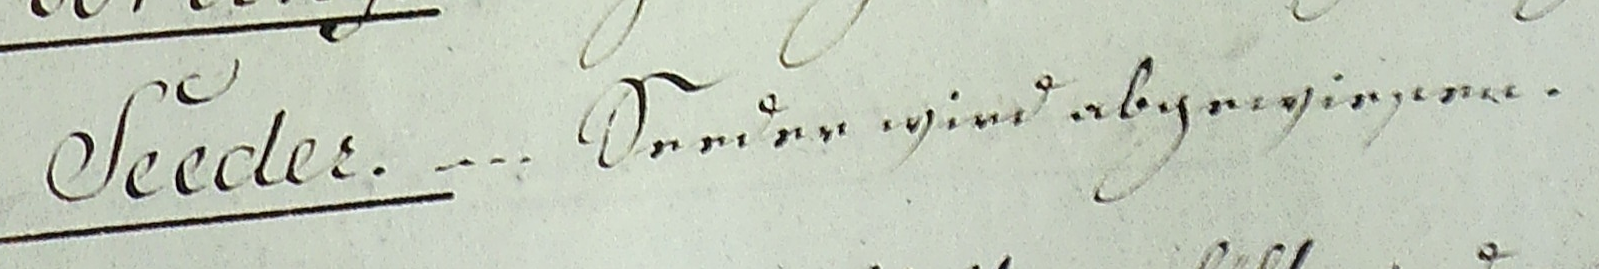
Seeder. .... Seeder wird abgewiesen.
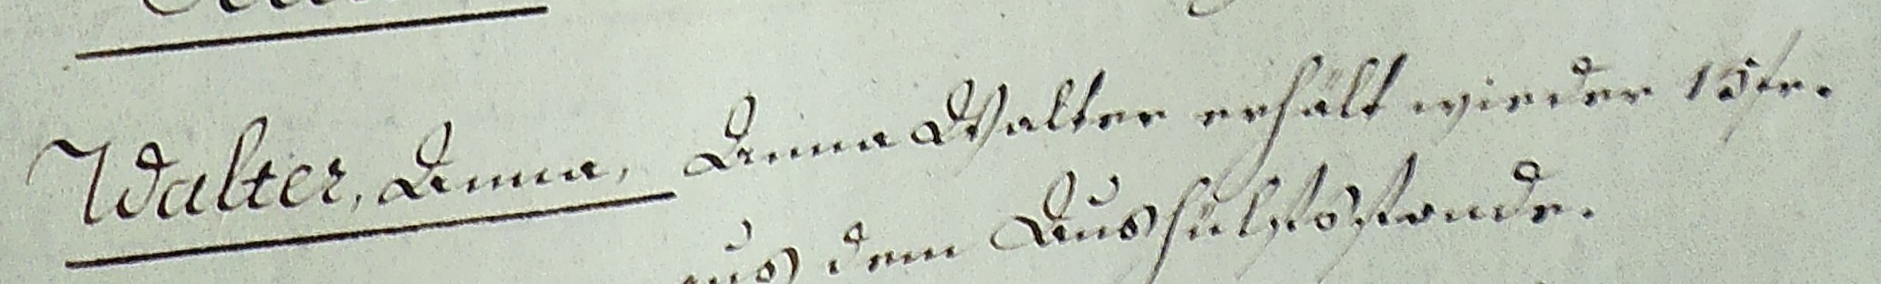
Walter, Anna. Anna Walter erhält wieder 15fr.
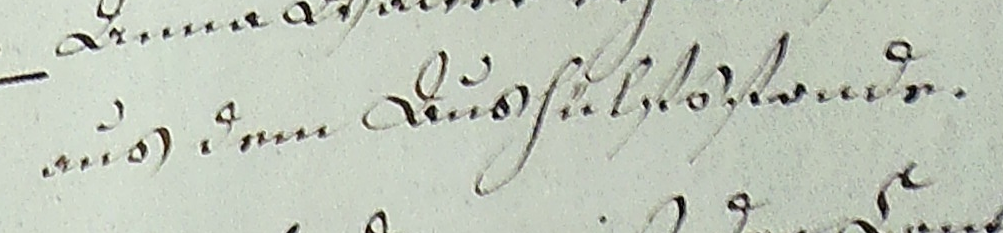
aus dem Aushülfsfonde.
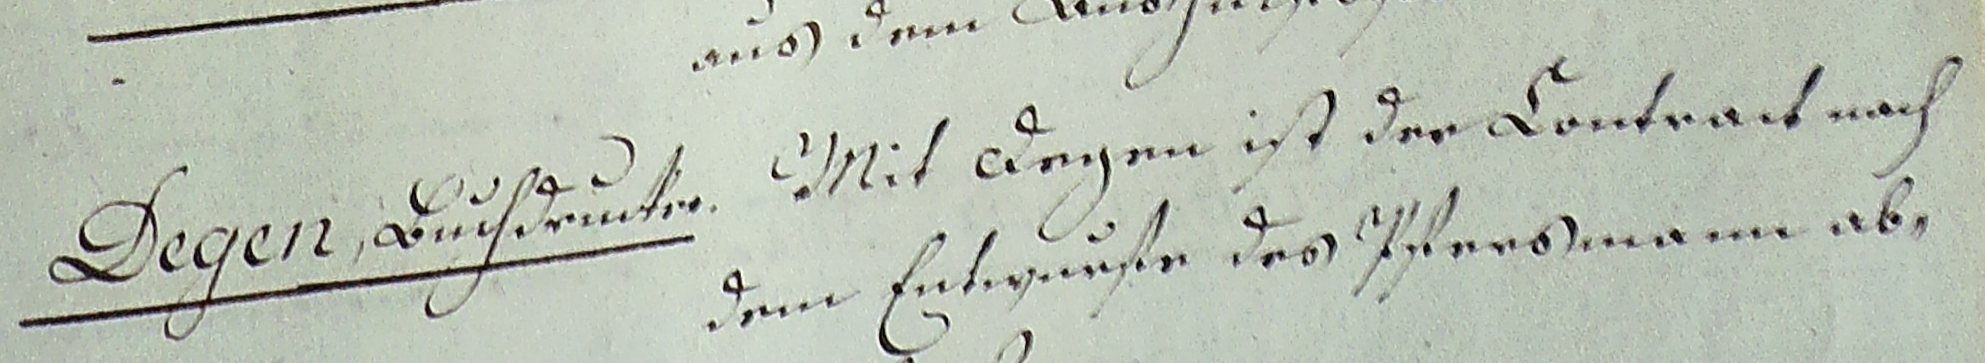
Degen, Buchdrucker. Mit Degen ist der Contract nach
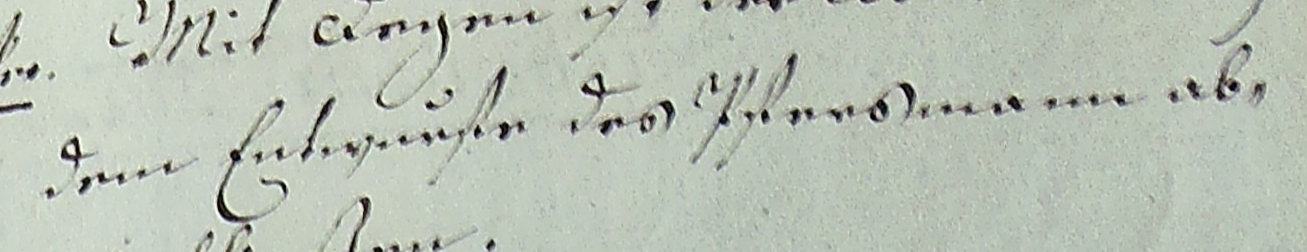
dem Entwurfe des Pfersmann ab¬
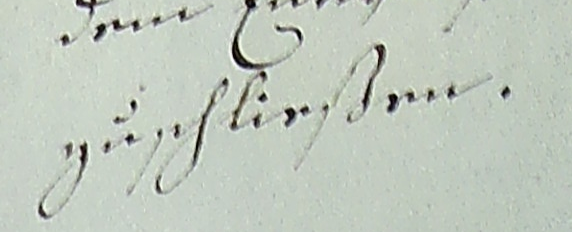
zuschließen.
